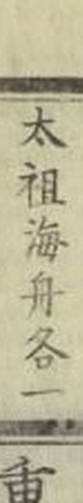太祖海舟各一
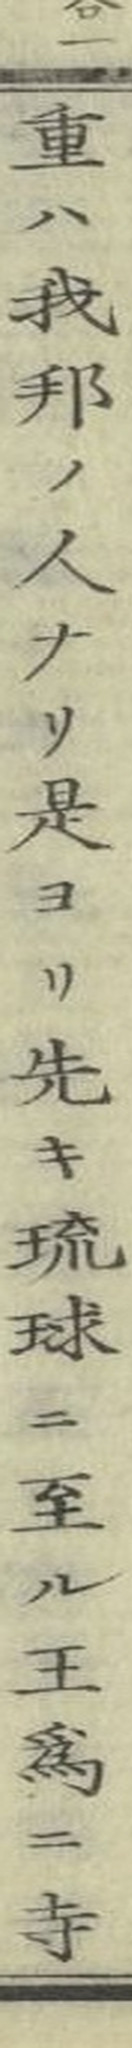重ハ我邦ノ人ナリ是ヨリ先キ琉球ニ至ル王爲ニ寺
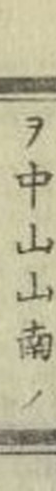ヲ中山山南ノ
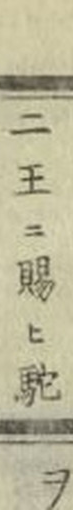二王ニ賜ヒ駝
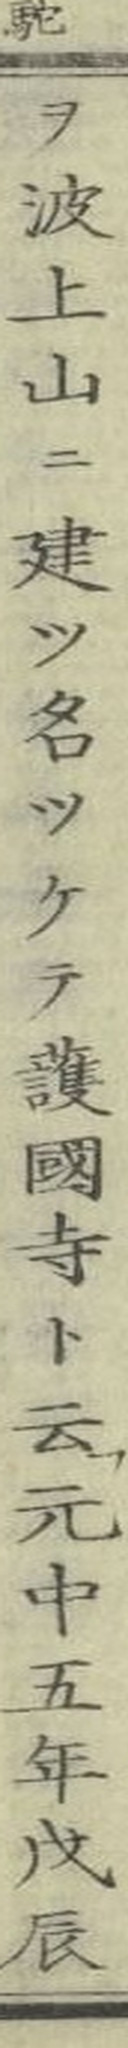ヲ波上山ニ建ツ名ツケテ護國寺ト云元中五年戊辰
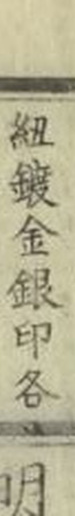紐鍍金銀印各
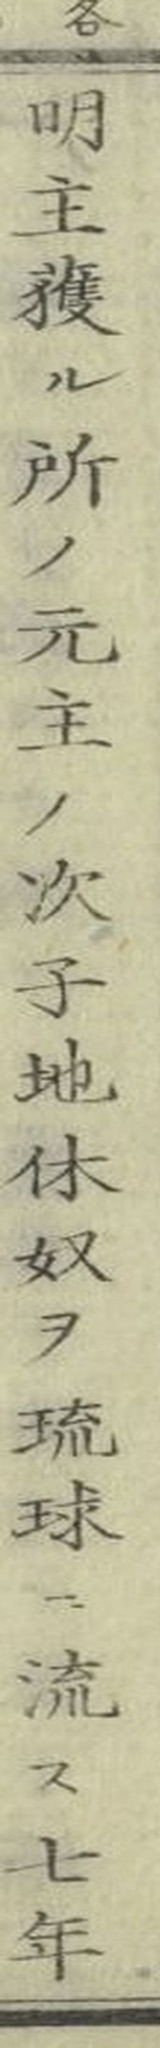明主獲ル所ノ元主ノ次子地休奴ヲ琉球ニ流ス七年
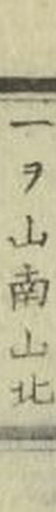一ヲ山南山北
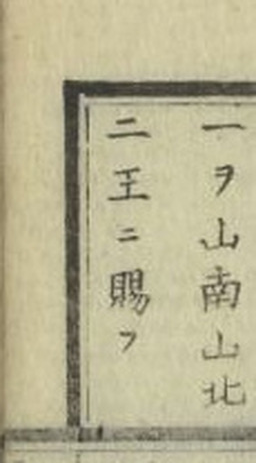ニ王ニ賜フ
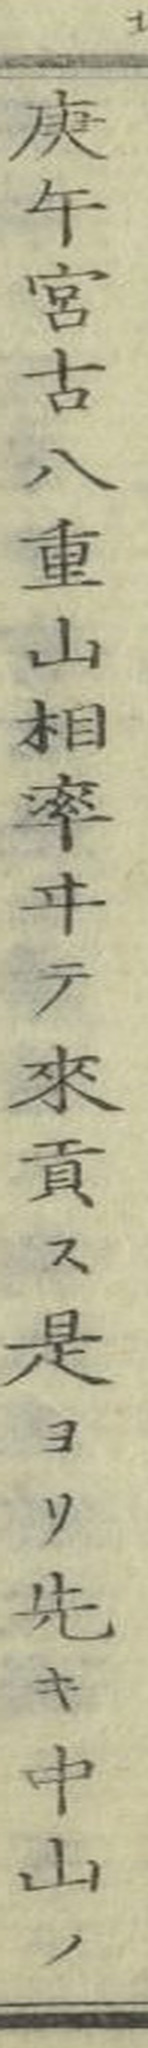庚午宮古八重山相率ヰテ來貢ス是ヨリ先キ中山ノ

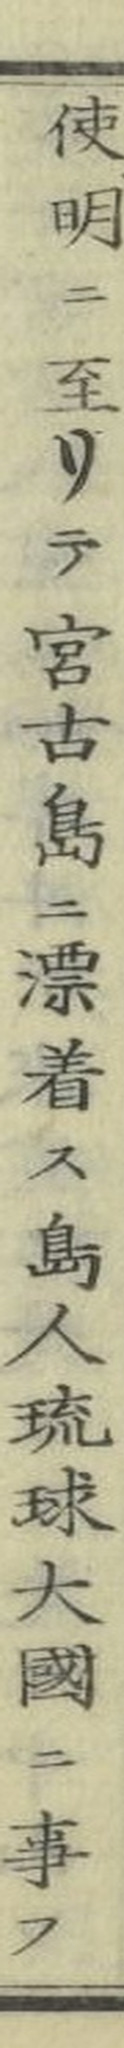使、明ニ至リテ宮古島ニ漂着ス島人琉球大國ニ事フ
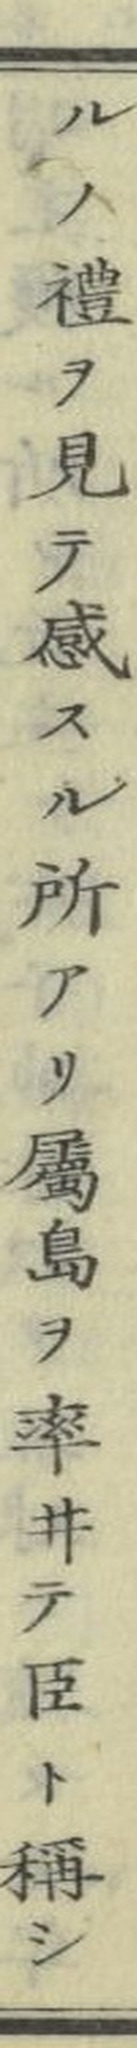ルノ禮ヲ見テ感スル所アリ屬島ヲ率ヰテ臣ト稱シ
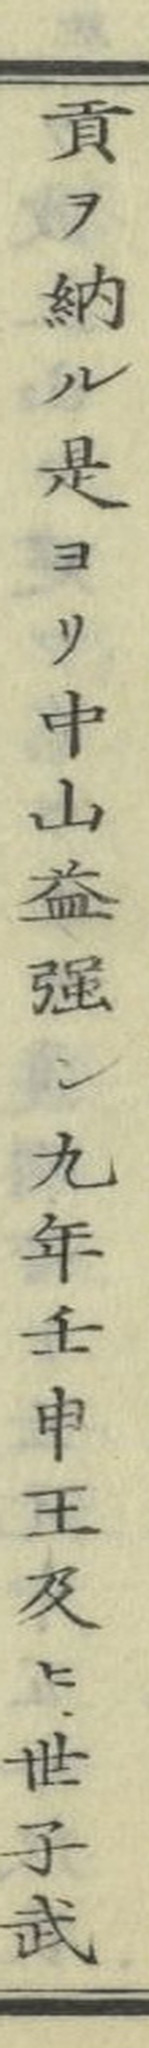貢ヲ納ル是ヨリ中山益强シ九年王壬申王及ヒ世子武
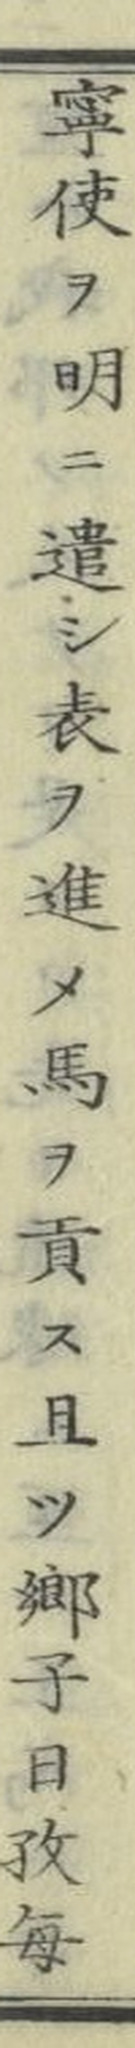寧使ヲ明ニ遣シ表ヲ進メ馬ヲ貢ス且ツ郷子日孜毎
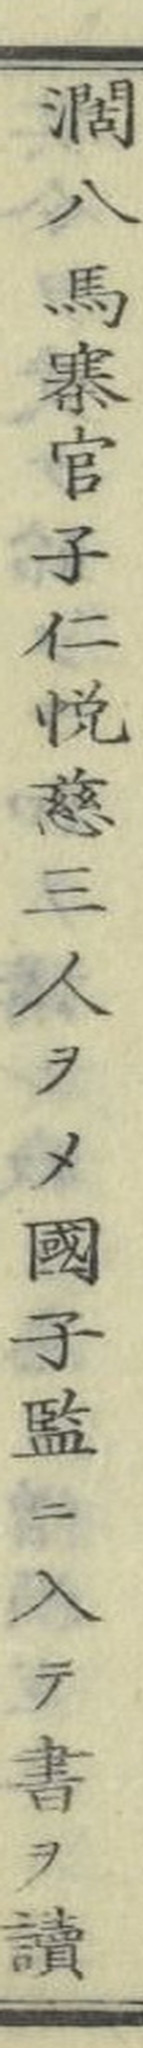濶八馬寨宮子仁悦慈三人ヲシテ國子監ニ入テ書ヲ讀
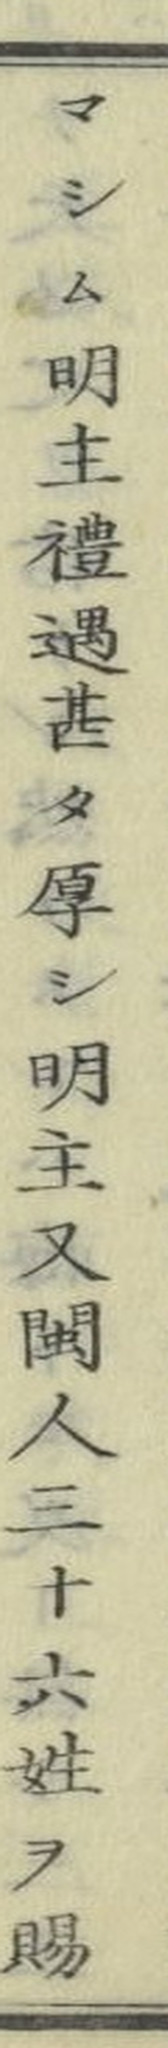マシム明主禮遇甚タ厚シ明主又閩人三十六姓ヲ賜
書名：琉球藩史 一之巻
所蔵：University of the Ryukyus Library
